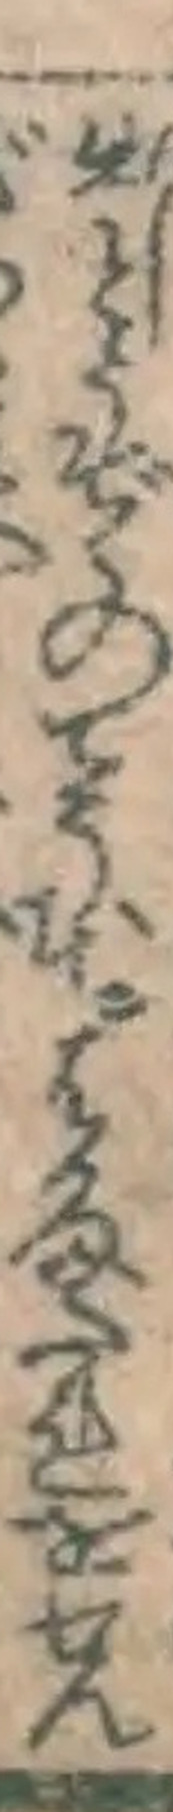出しとうぞくのてう本にはかまたれをせん
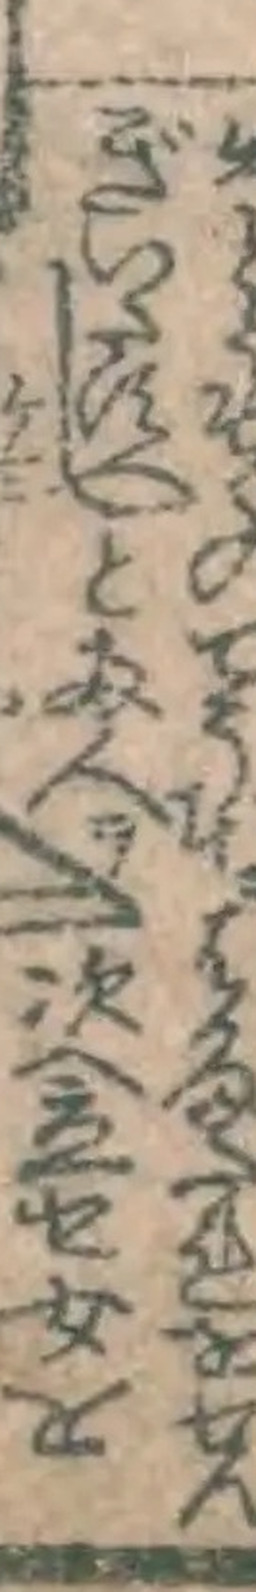ぎいたすべしと両人を次へ立せ女を
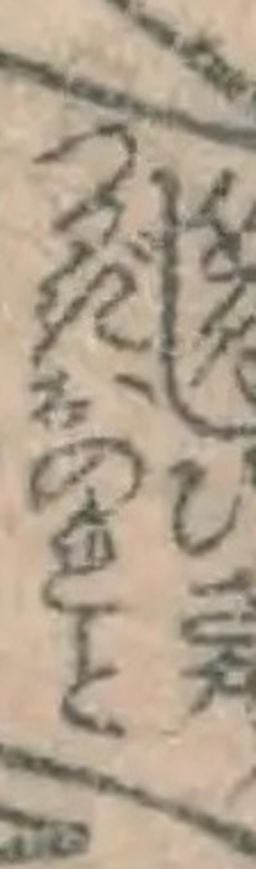つるぎおのれと
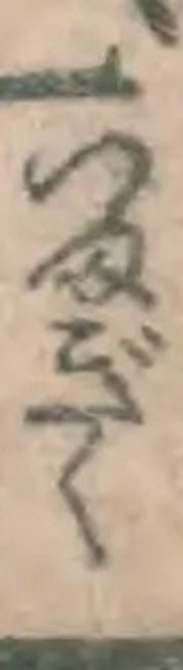つまぎく
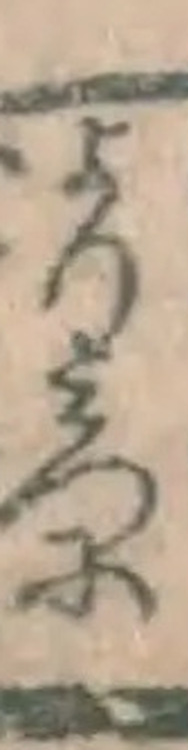よりみつに
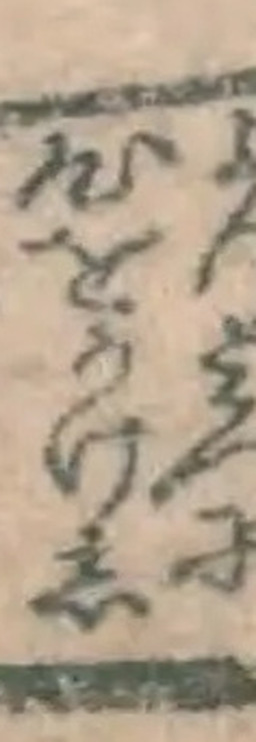心をかけし
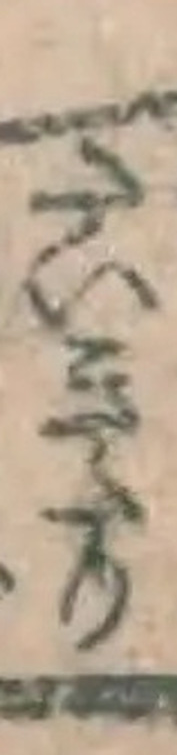たいきたり
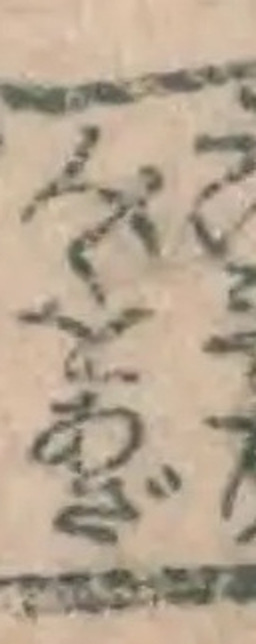人〳〵をあざ
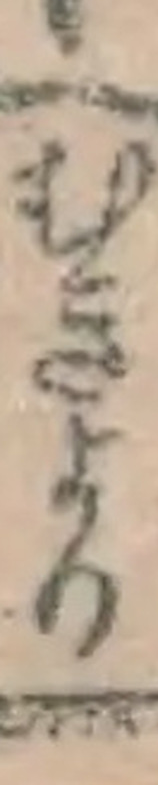むきより
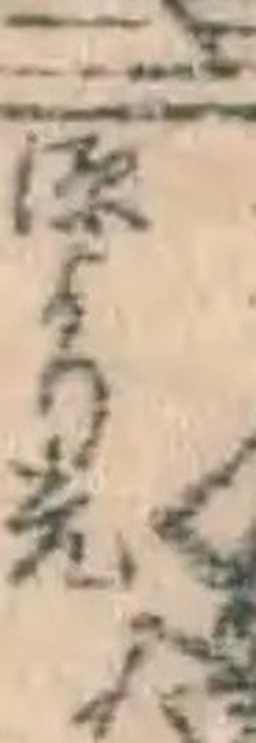源より光
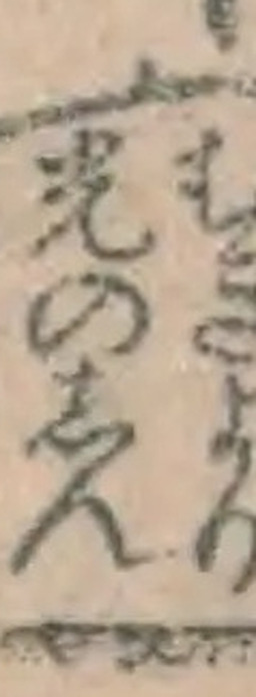光のしん
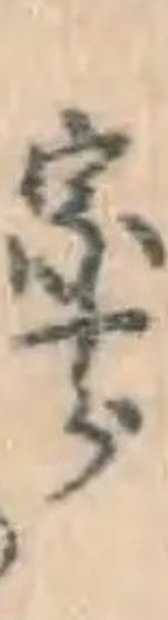宗十郎
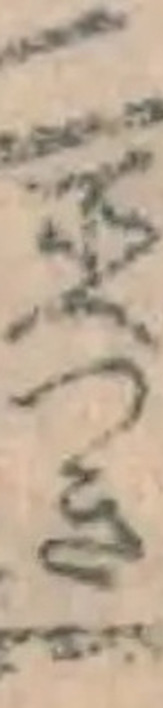所へつき
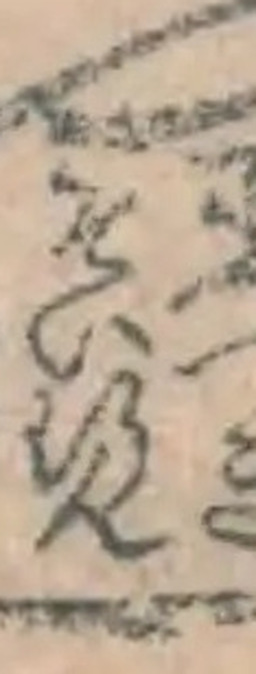そい行ん
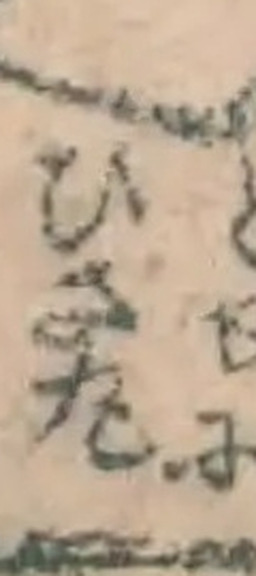ひさ丸
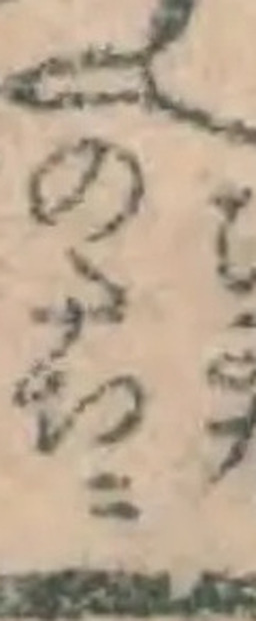のたちに
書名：四天王宿直着綿
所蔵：国立国会図書館 National Diet Library, JAPAN
